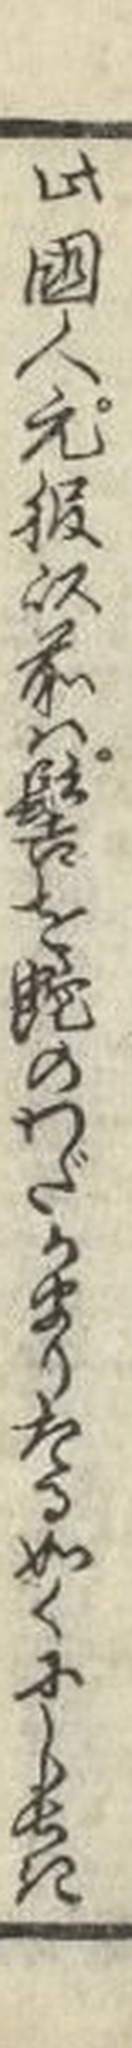此国人。元服以前は。髻を蛇のわだかまりたる如くにし長き
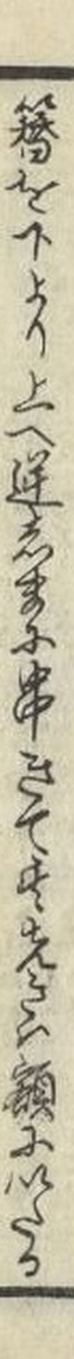簪を下より上へ逆しまに串きて其先きは額にいたる
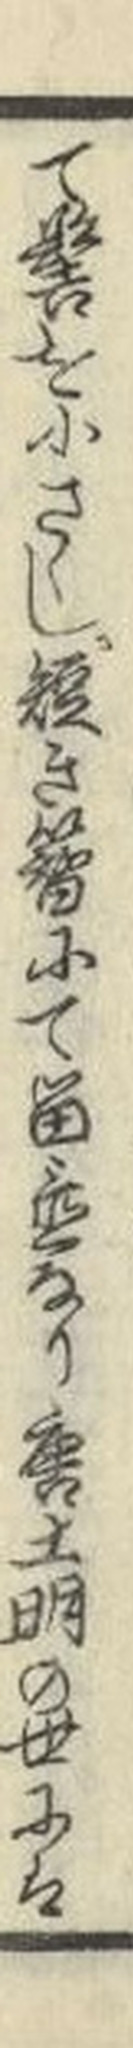て髻を小さくし。短き簪にて留置なり唐土明の世には
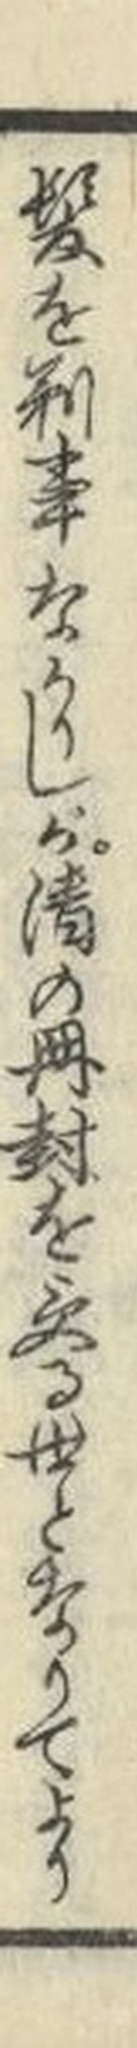髪を剃事なかりしが。清の冊封を受る世となりてより
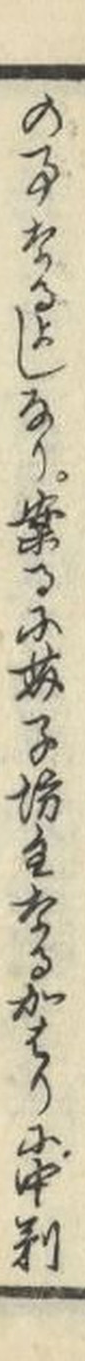の事なるよしなり。案るに芥子坊主なるかはりに。中剃
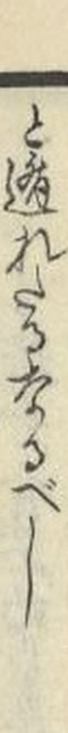と遁れたるなるべし
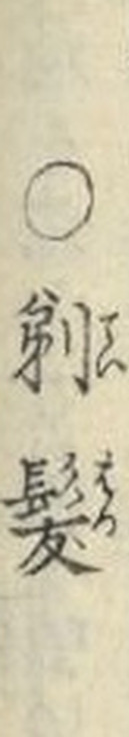○剃髪
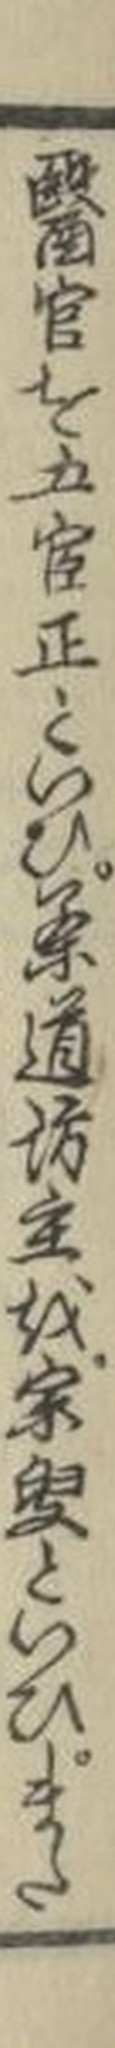医官を五宦正といひ。茶道坊主を。宗叟といひ。また
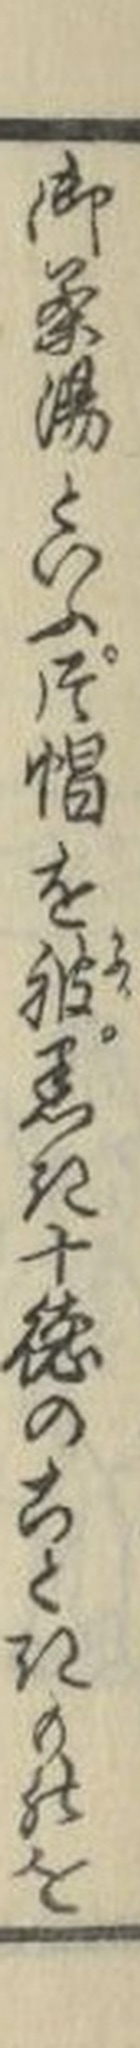御茶湯といふ。片帽を被。黒き十徳のこときものを
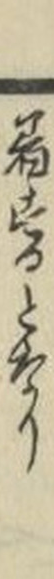着するとなり
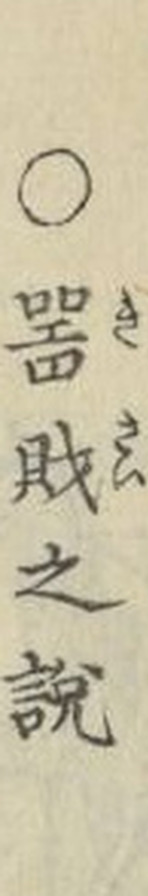○器財之説
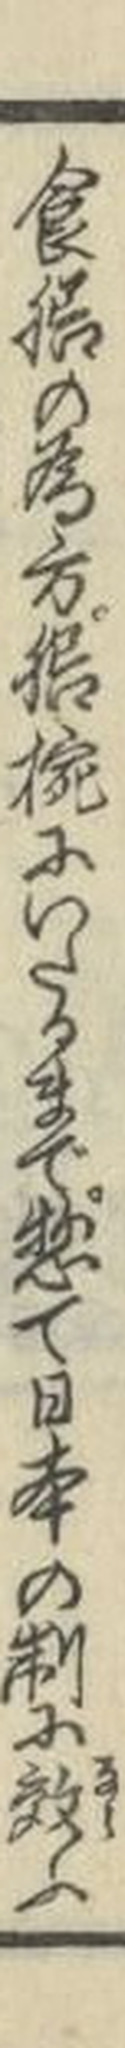食膳の為方。膳椀にいたるまで。惣て日本の制に效ふ
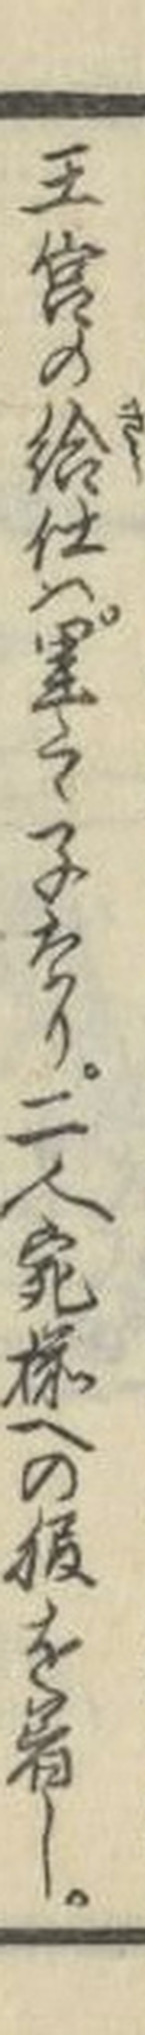王宮の給仕は。里之子なり。二人宛揃への服を着し。
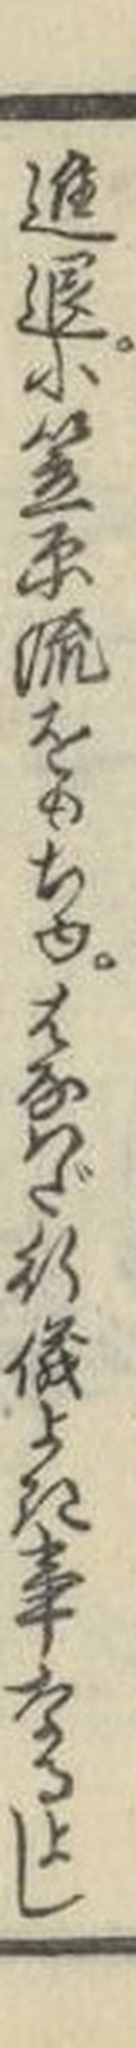進退。小笠原流をもちゆ。はなはだ行儀よき事なるよし
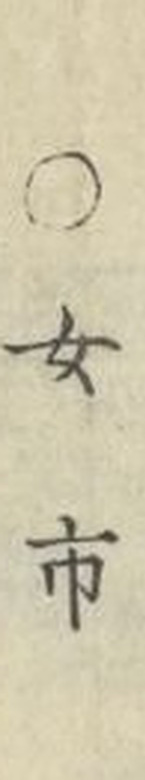○女市
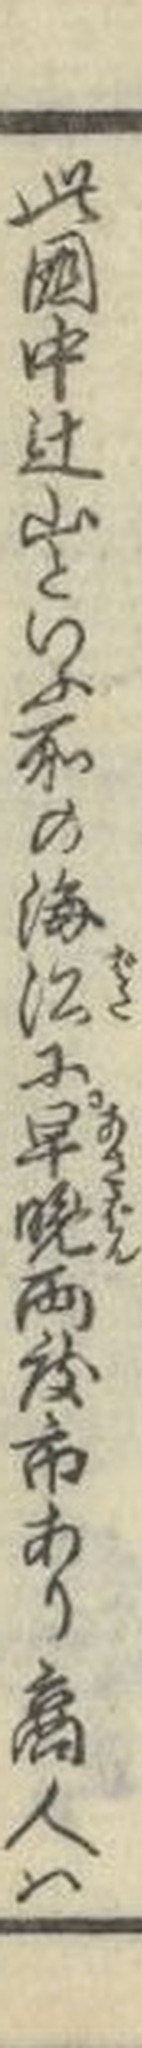此国中辻山といふ所の海沿に。早晩両度市あり商人は
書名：琉球解語
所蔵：University of the Ryukyus Library
